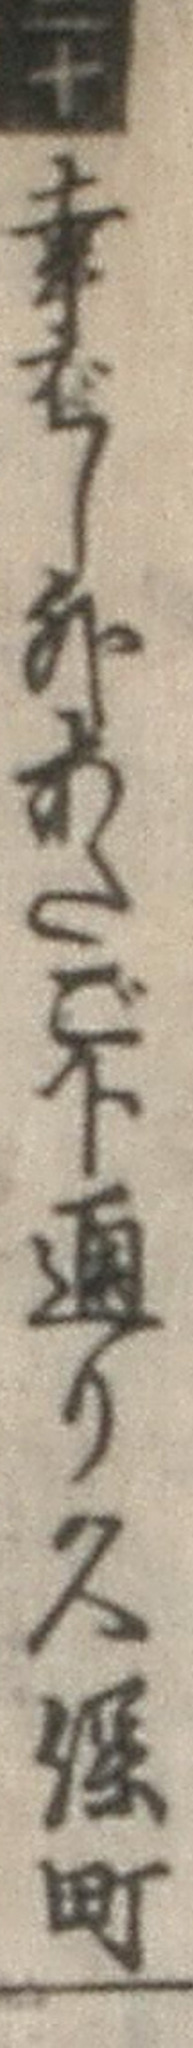二十幸ばし外あたご下通り久保町
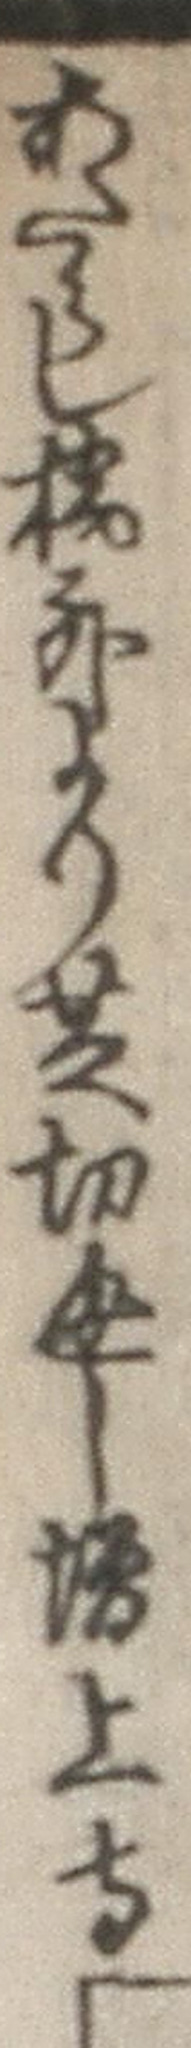あたらし橋外より芝切通し増上寺
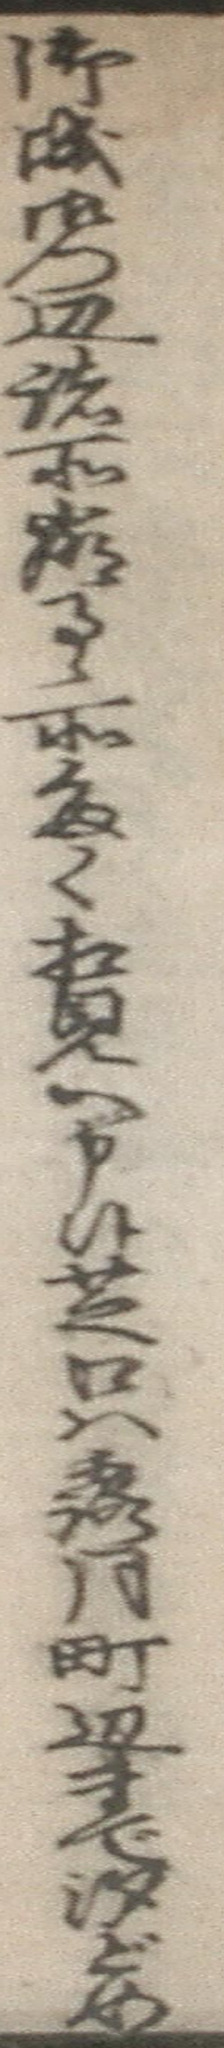御成御門辺諸所崩るゝ所多く相見へ申候芝口は露月町辺まで汐どめ
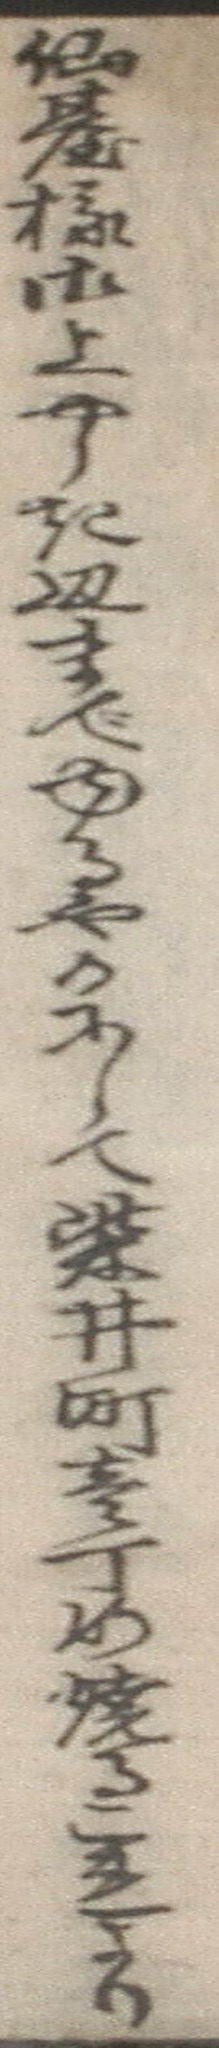仙台様御上やしき辺までゆるやかにして柴井町壱丁め焼るこれより
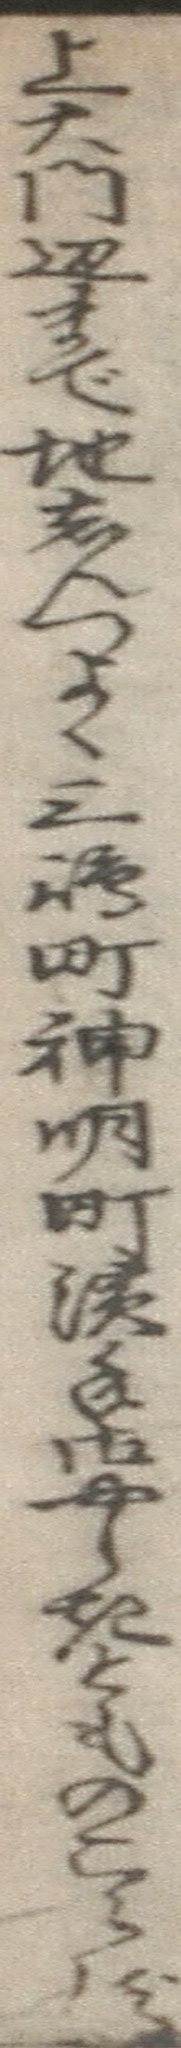上大門辺まで地しんつよく三嶋町神明町浜手御やしきとものこらず
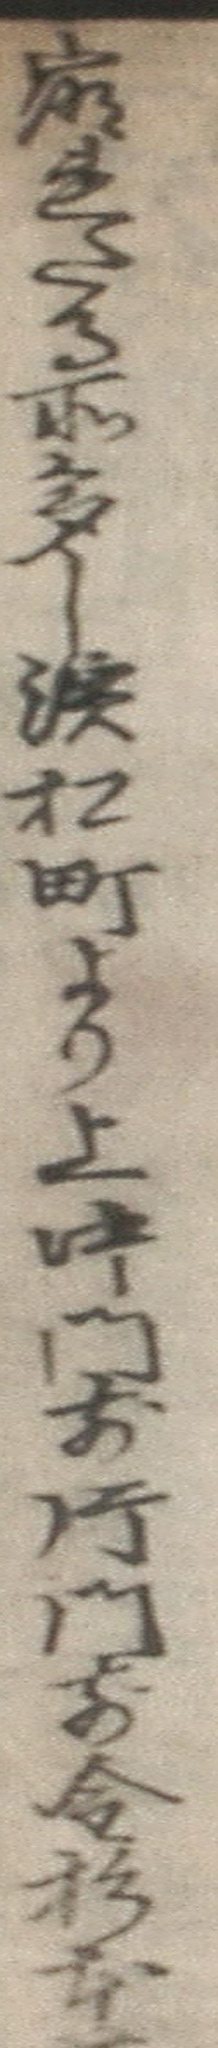崩れたる所多し浜松町より上中門前片門前金杉本芝田町
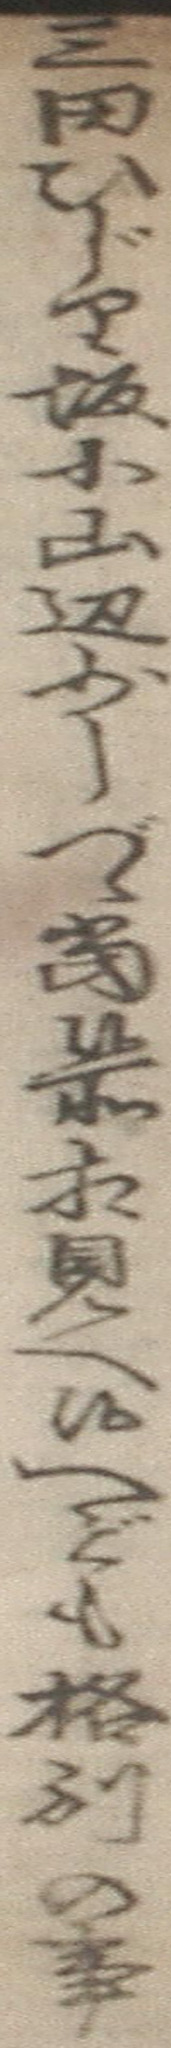三田ひじり坂小山辺少しづゝ当候所相見へ候へども格別の事
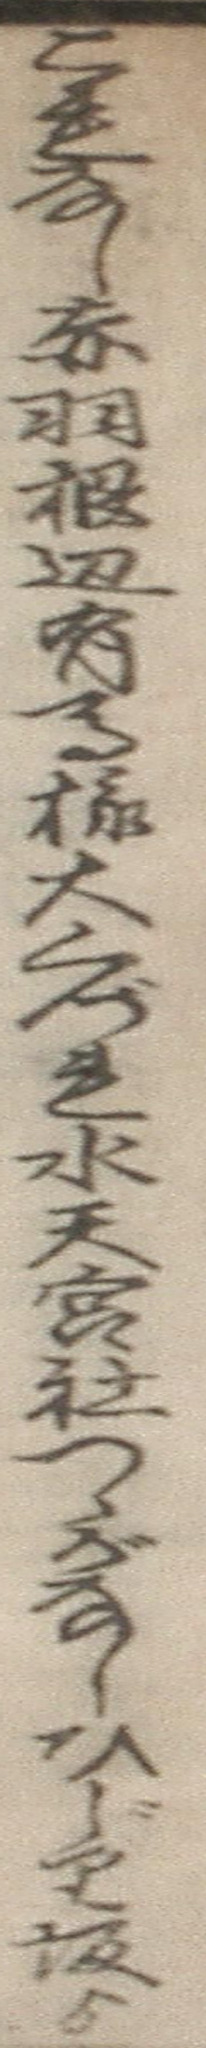これなし赤羽根辺有馬様大くづれ水天宮つゝがなしひじり坂ゟ
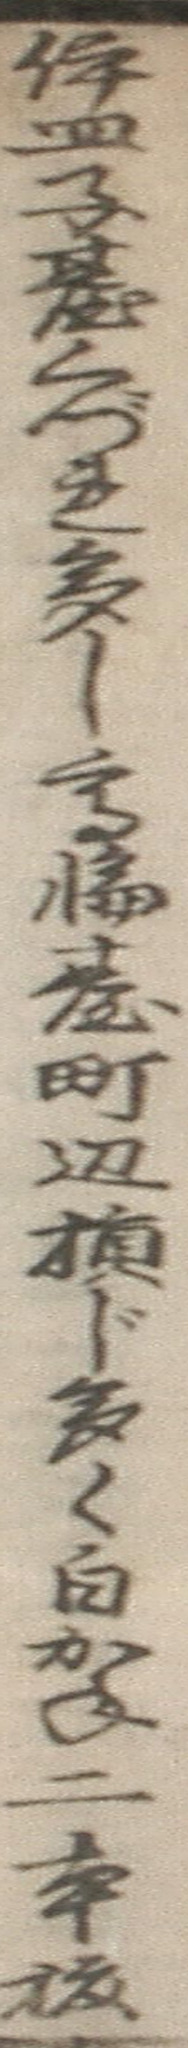伊皿子台くづれ多し高輪台町辺損じ多く白かね二本榎
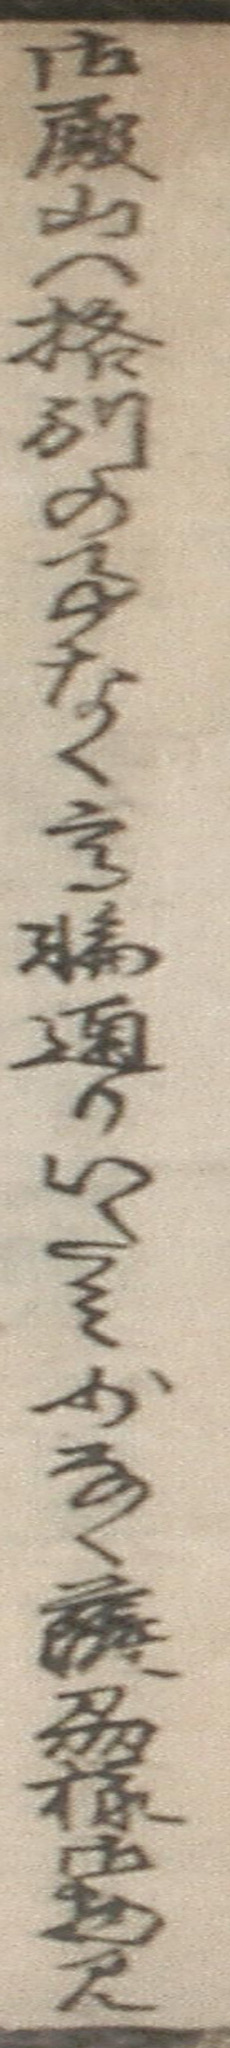御殿山は格別の事なく高輪通りいたみ少なく薩州様御物見
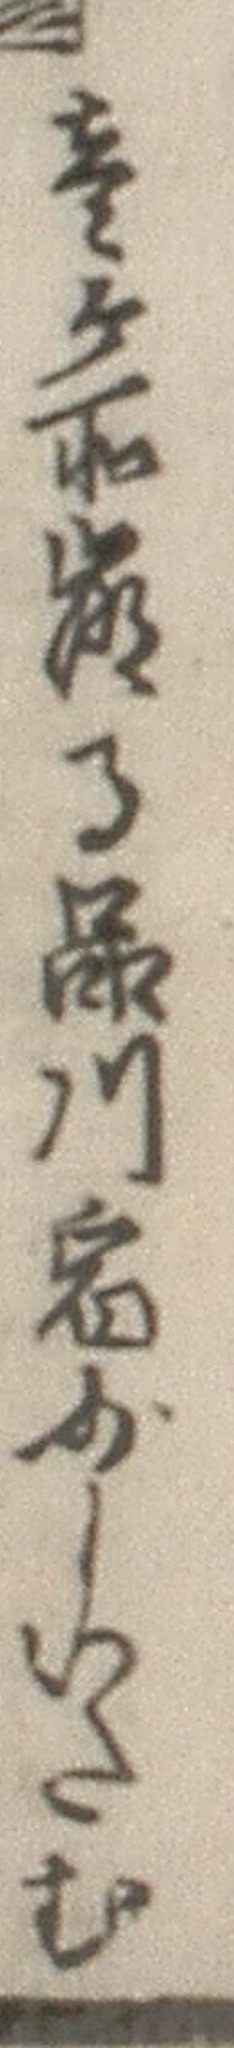壱ヶ所崩る品川宿少しいたむ
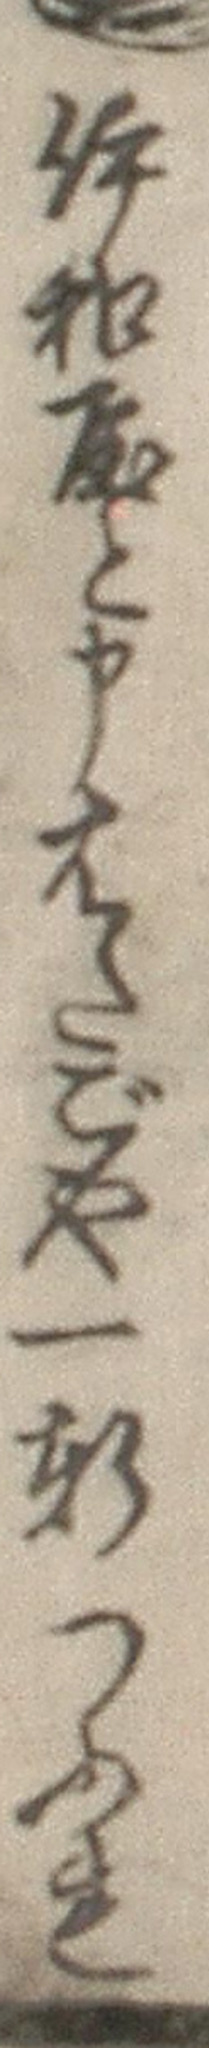伊知屋と申はたごや一軒つふれ
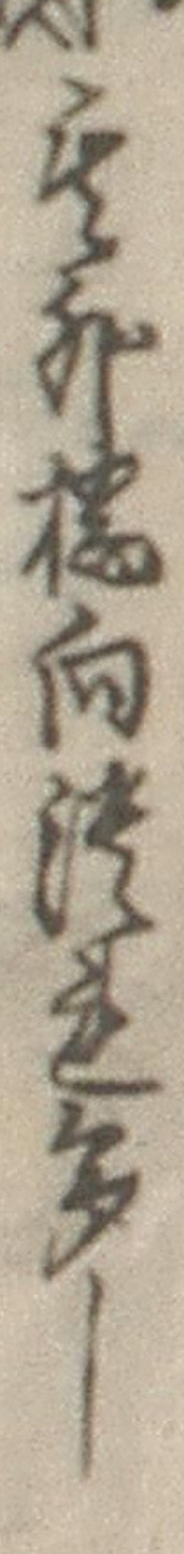其外橋向潰れ多し
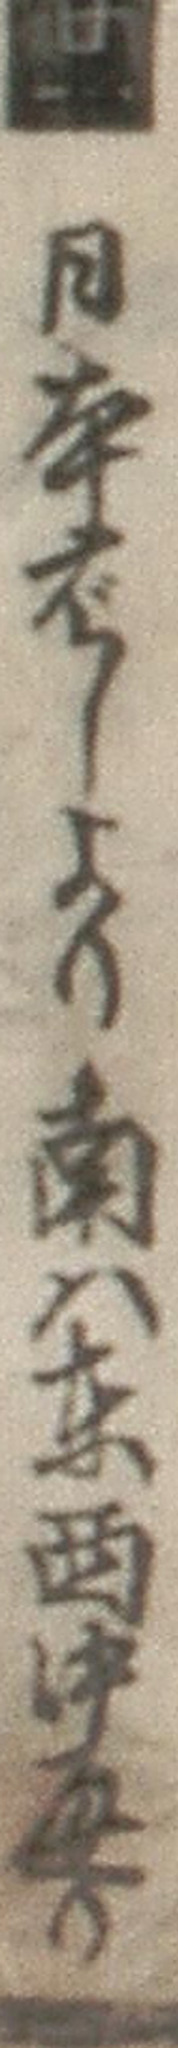廿一日本ばしより南は東西中通り
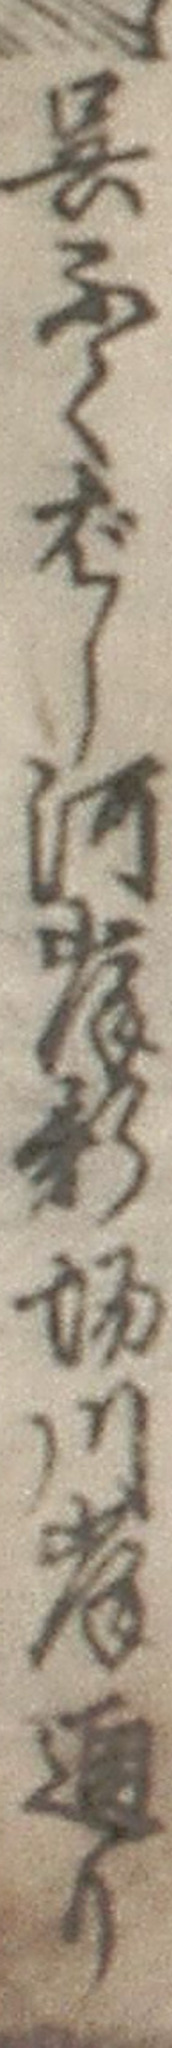呉ふくばし河岸新場川岸通り
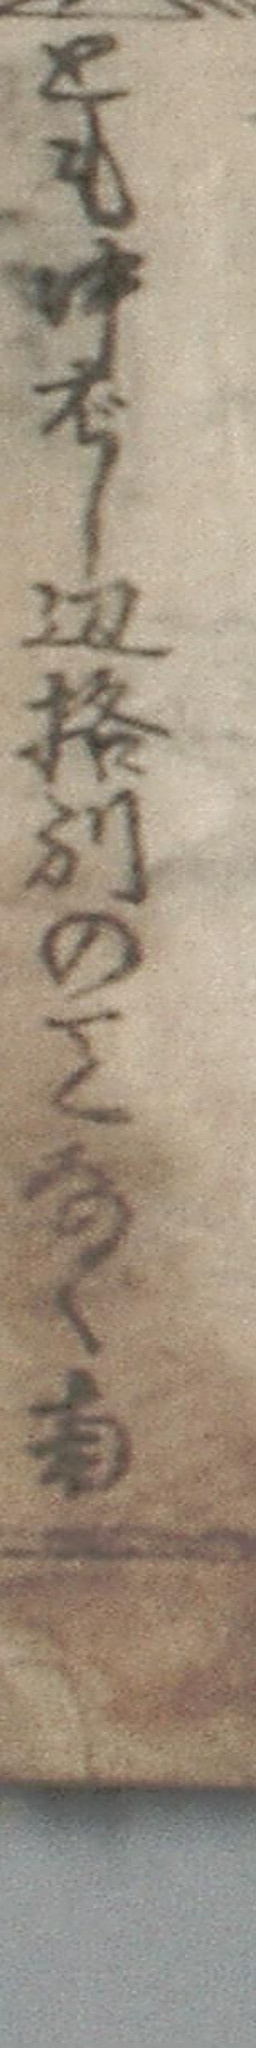とも中ばし辺格別のことなく南
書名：江戸大地震末代鑑
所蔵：東京大学地震研究所図書室 Earthquake Research Institute Library, The University of Tokyo, JAPAN
